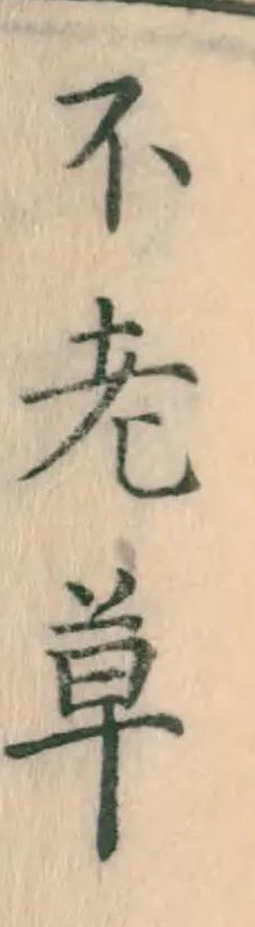不老草

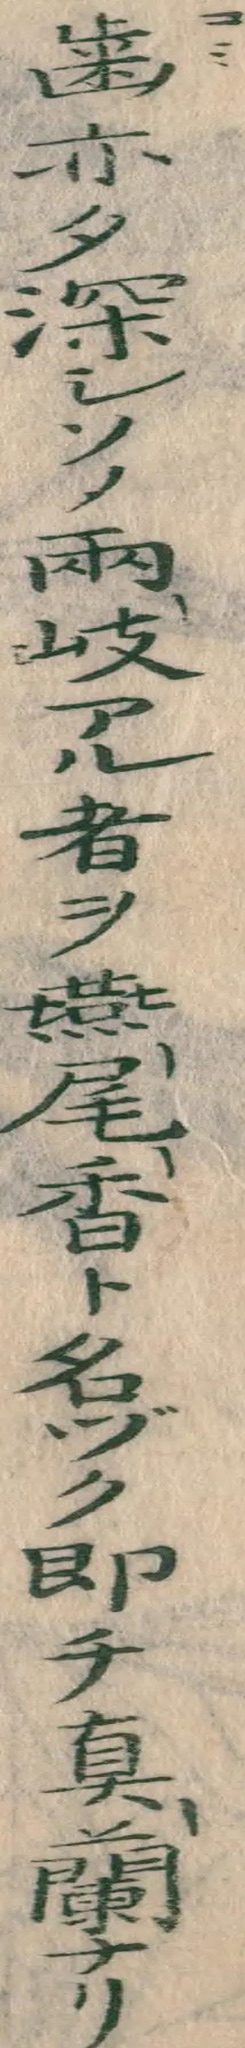歯亦タ深シソノ両-岐アル者ヲ燕-尾-香ト名ヅク即チ真-蘭ナリ
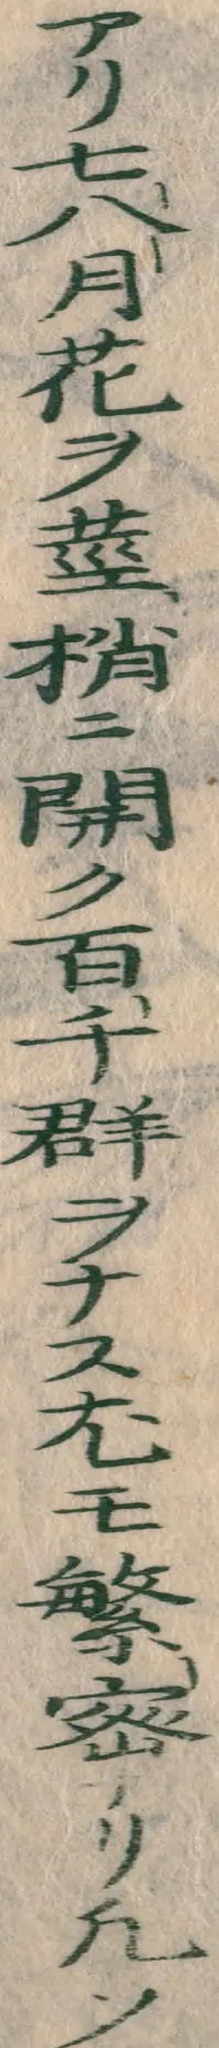アリ七-八-月花ヲ茎-梢ニ開ク百-千群ヲナス尤モ繁-密リ凡ソ
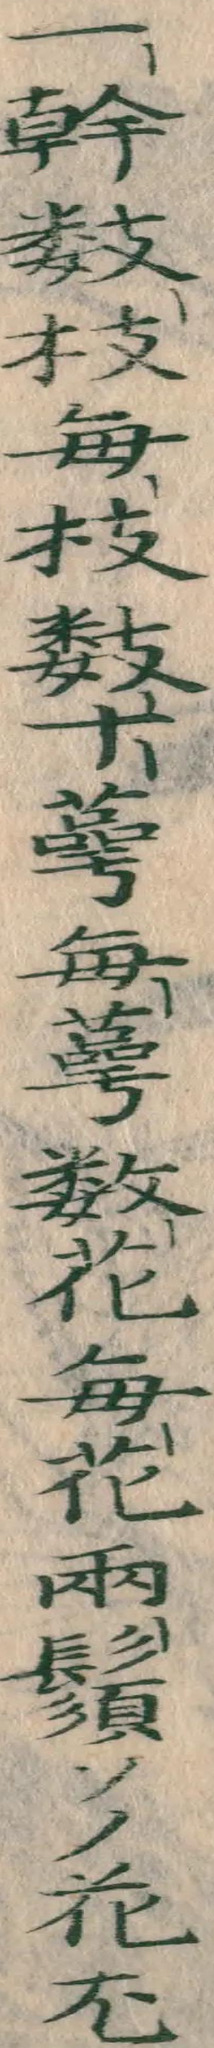一-幹数-枝毎-枝数-十-萼毎-萼数-花毎-花両-鬚ソノ花尤
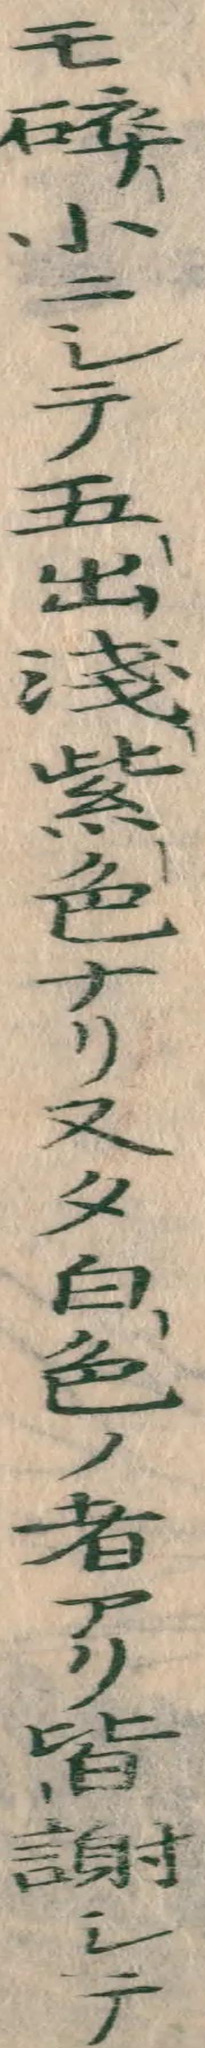モ砕-小ニシテ五-出浅-紫-色ナリ又タ白-色ノ者アリ皆-謝シテ
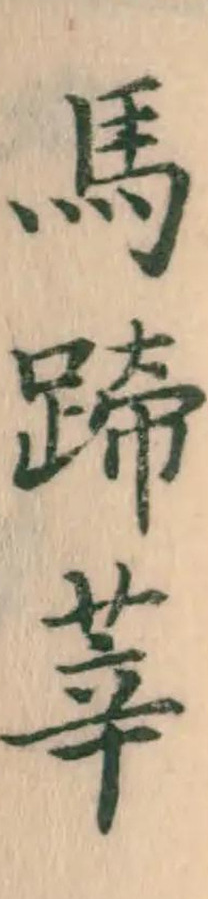馬蹄莘

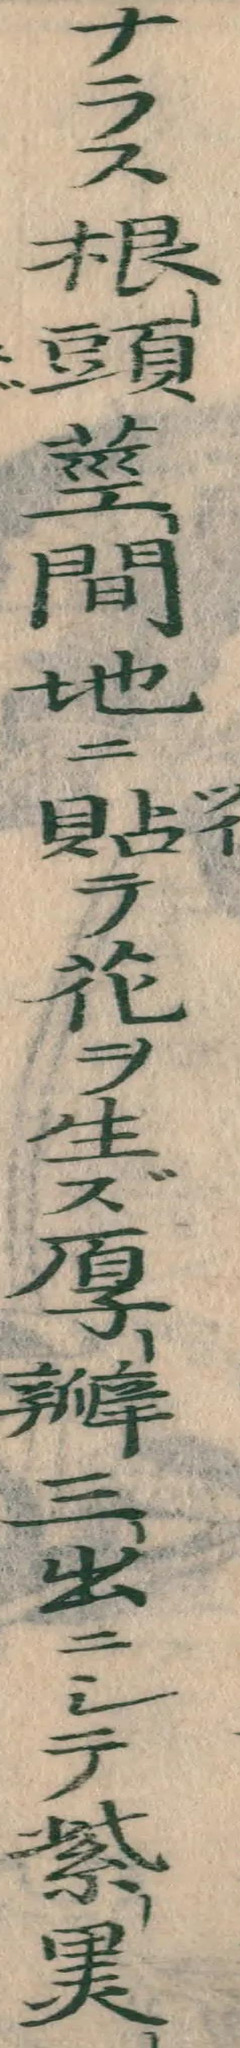ナラス根-頭茎-間地ニ貼テ花ヲ生ズ厚-弁三-出ニシテ紫-黒-
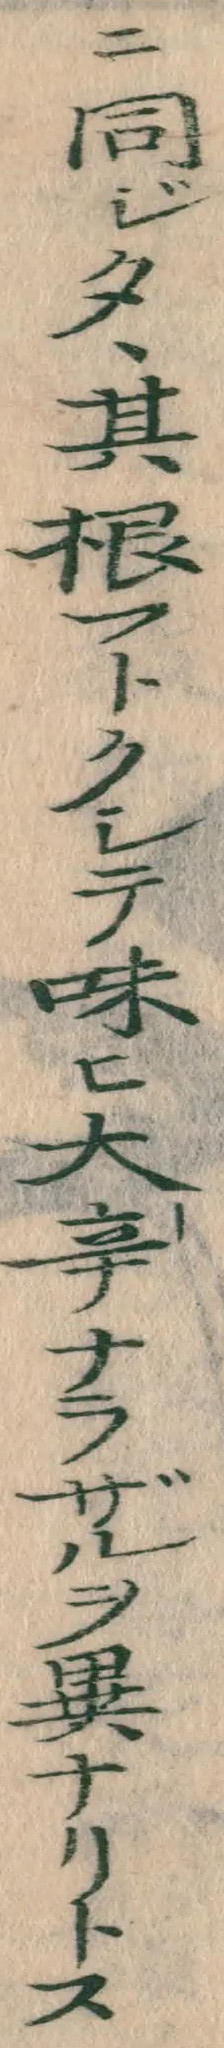ニ同ジタヽ其根フトクシテ味ヒ大-辛ナラザルヲ異ナリトス
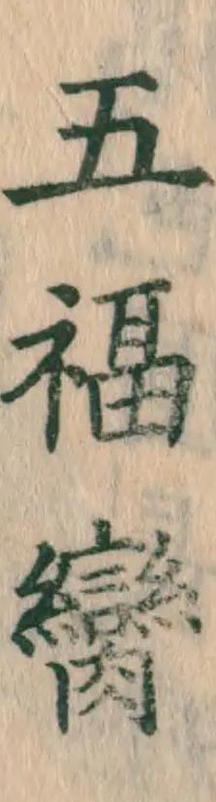五福臠

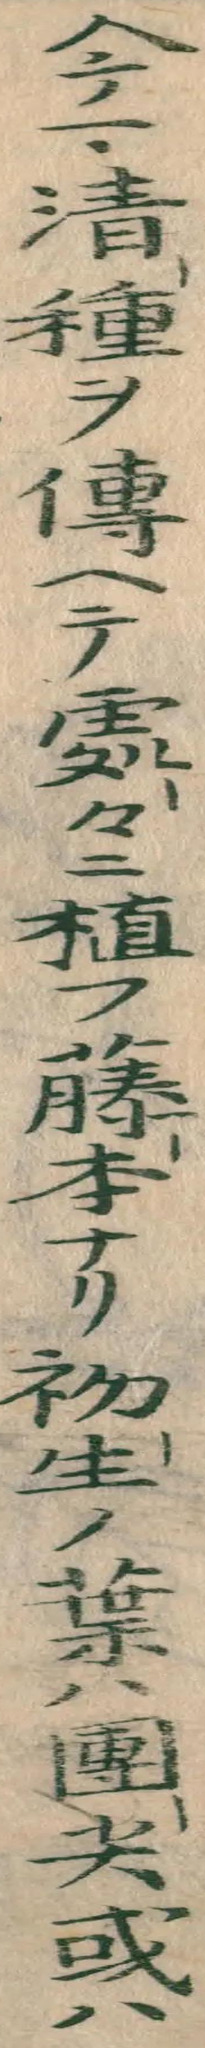今マ清-種ヲ伝ヘテ処-々ニ植フ藤-本ナリ初-生ノ葉ハ団-尖或ハ
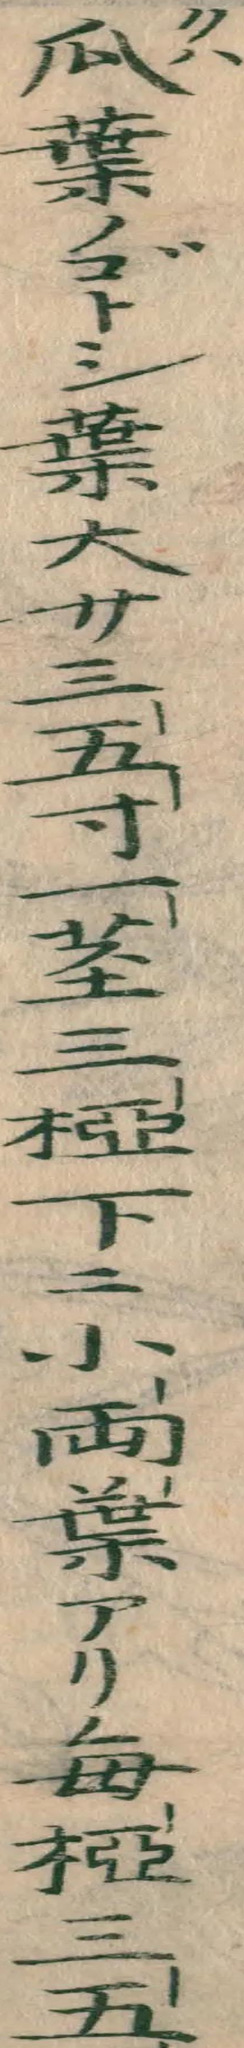瓜葉ノゴトシ葉大サ三-五-寸一-茎三-椏下ニ小-両-葉アリ毎-椏三-五-
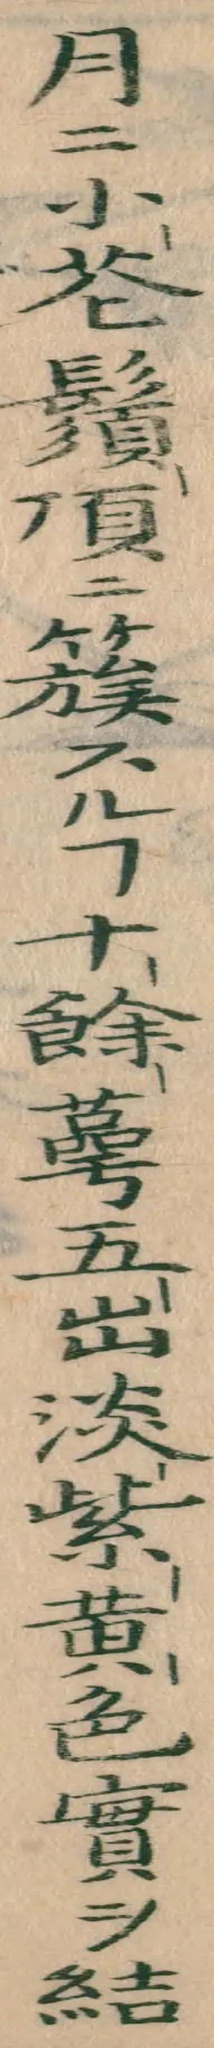月ニ小-花鬚-頂ニ簇スルコト十-余-萼五-出淡-紫-黄-色実ヲ結
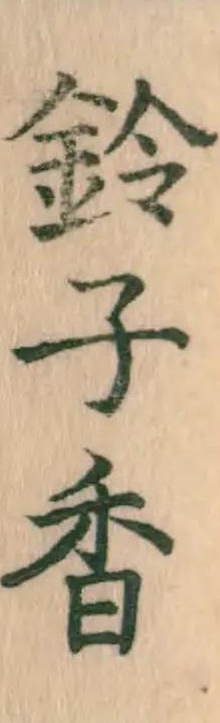鈴子香

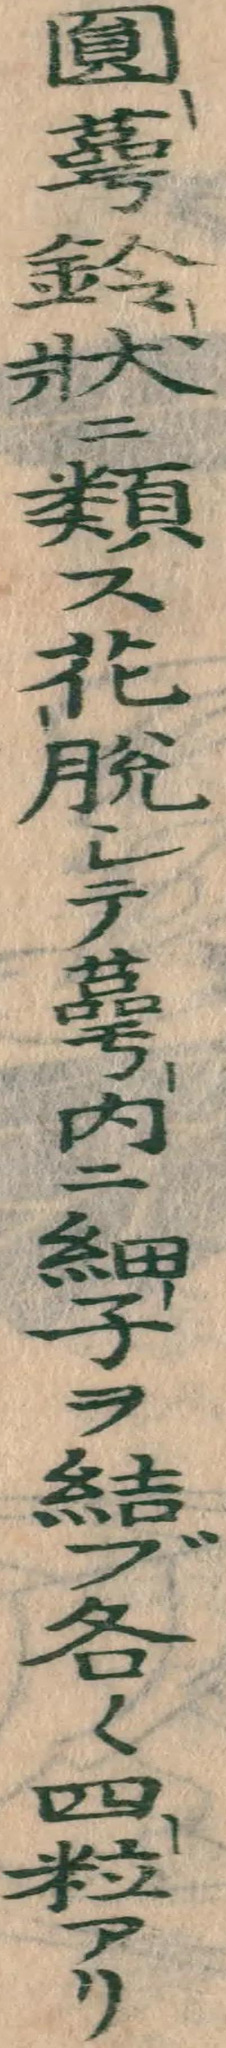円-萼鈴-状ニ類ス花-脱シテ萼-内ニ細-子ヲ結ブ各々四-粒アリ

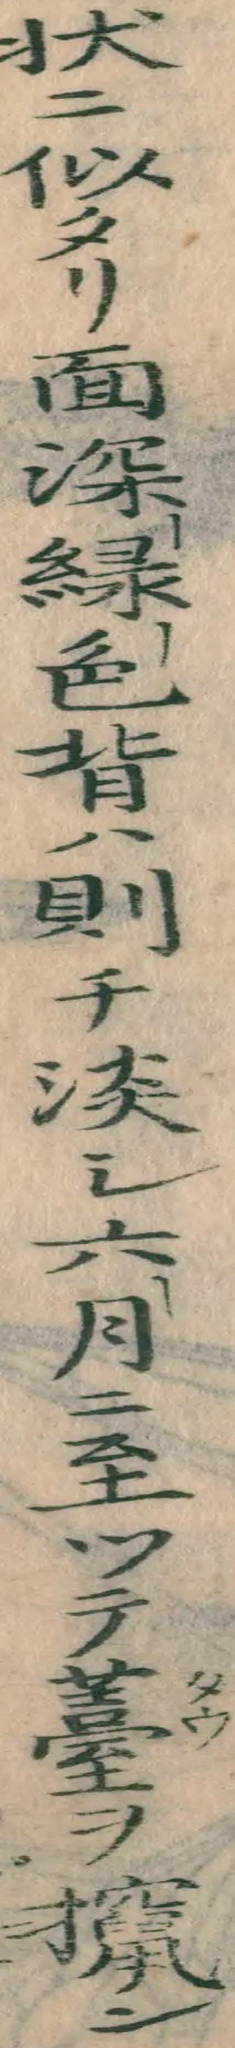状ニ似タリ面深-緑-色背ハ則チ淡シ六-月ニ至ツテ薹ヲ攛ン
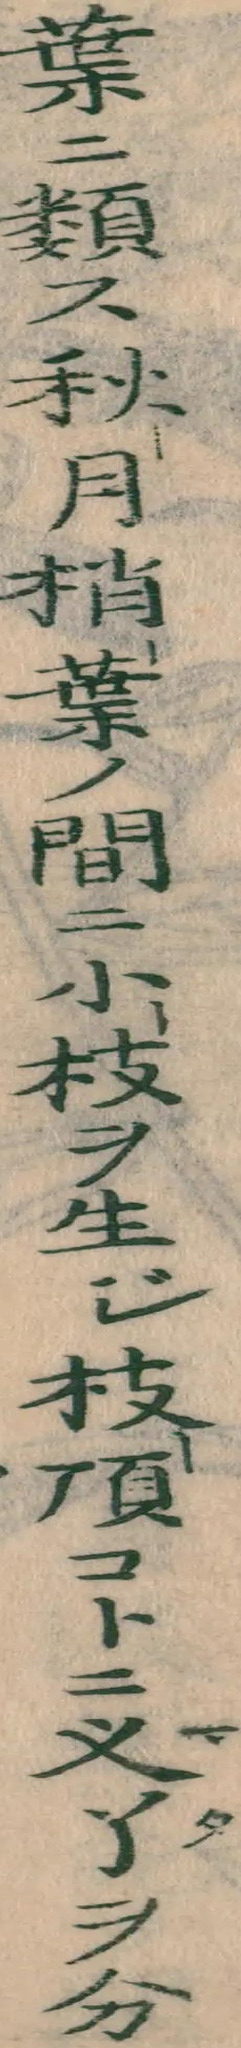葉ニ類ス秋-月梢-葉ノ間ニ小-枝ヲ生ジ枝-頂コトニ叉丫ヲ分
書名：花彙 草部4巻木部4巻. [1]
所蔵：国立国会図書館 National Diet Library, JAPAN
